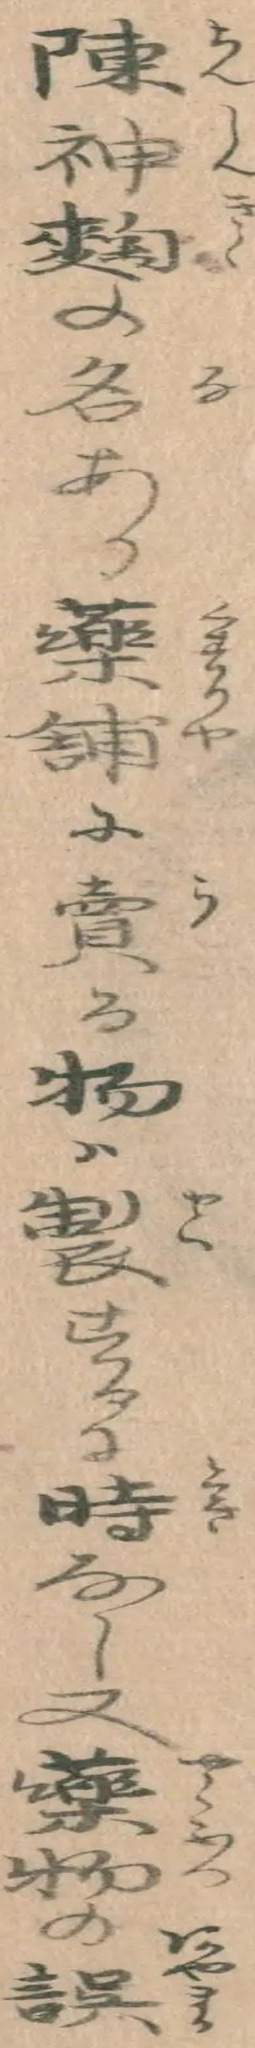陳神麹の名あり薬舗に売る物は製するに時なし又薬物の誤
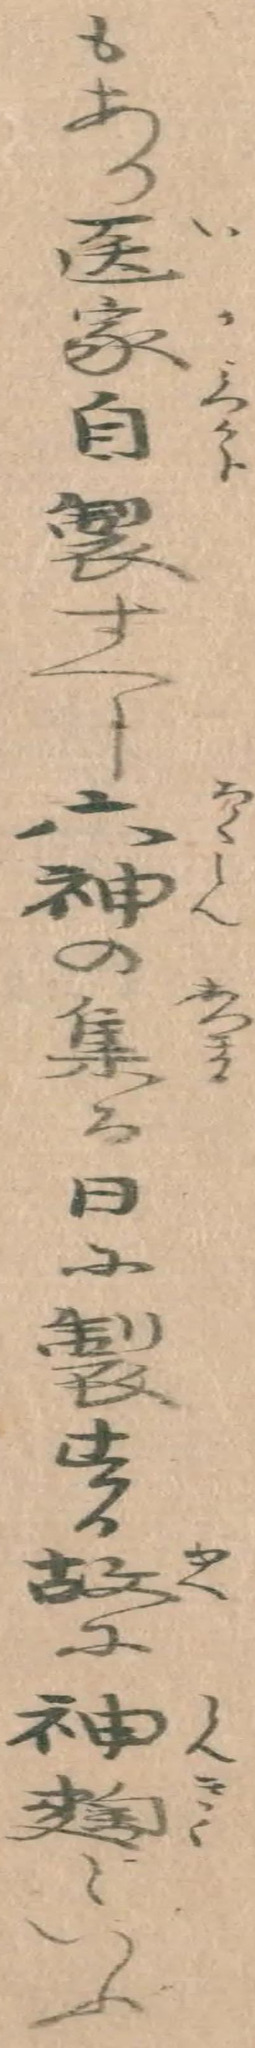もあり医家自製すへし六神の集る日に製する故に神麹といふ
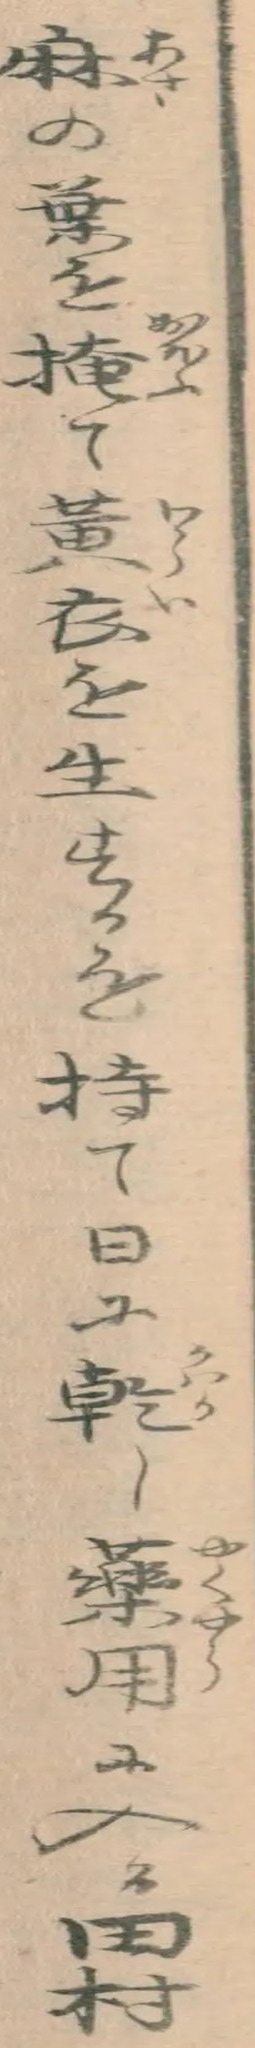麻の葉を掩て黄衣を生するを持て日に乾し薬用に入る田村
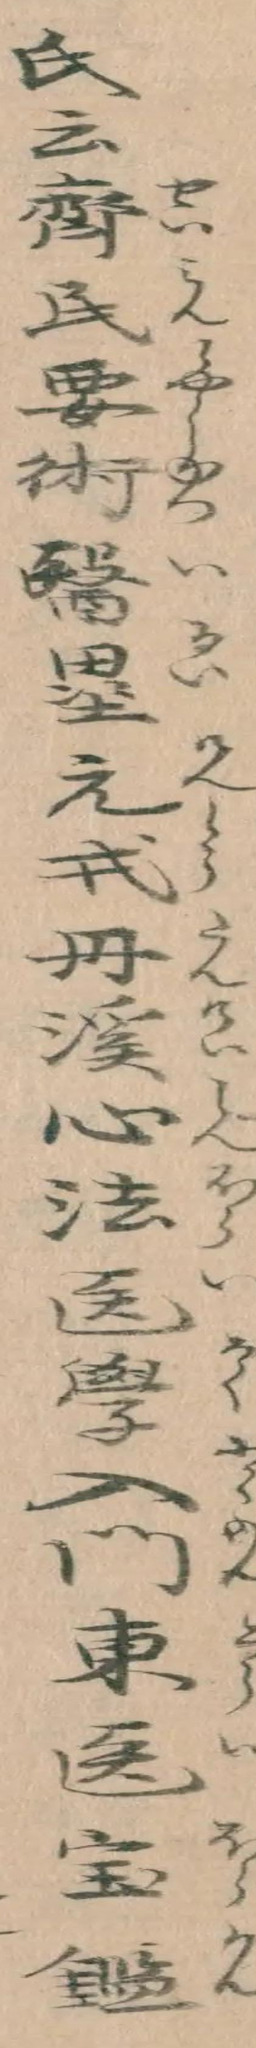氏云斉民要術医塁元戎丹渓心法医学入門東医宝鑑
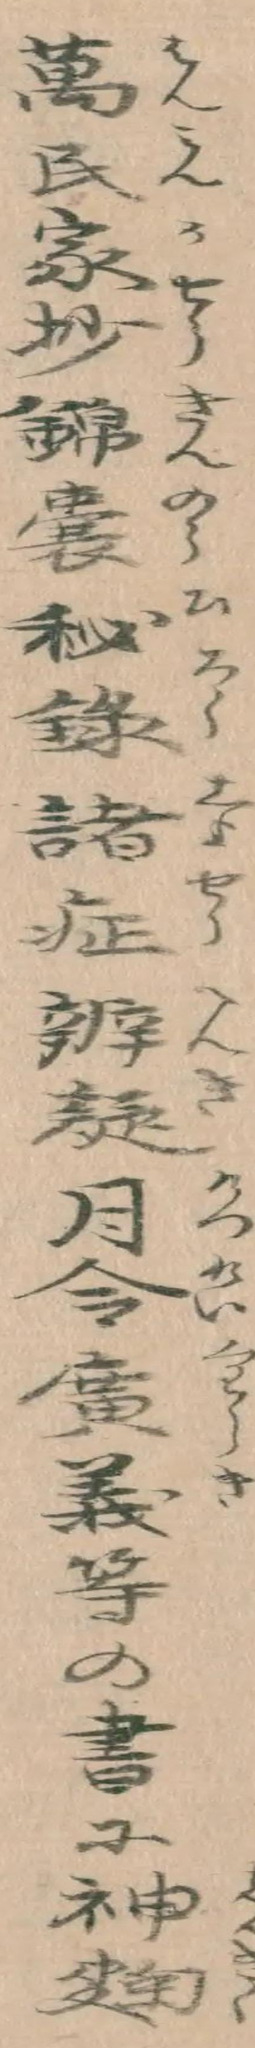万民家抄錦嚢秘録諸症弁疑月令広義等の書に神麹
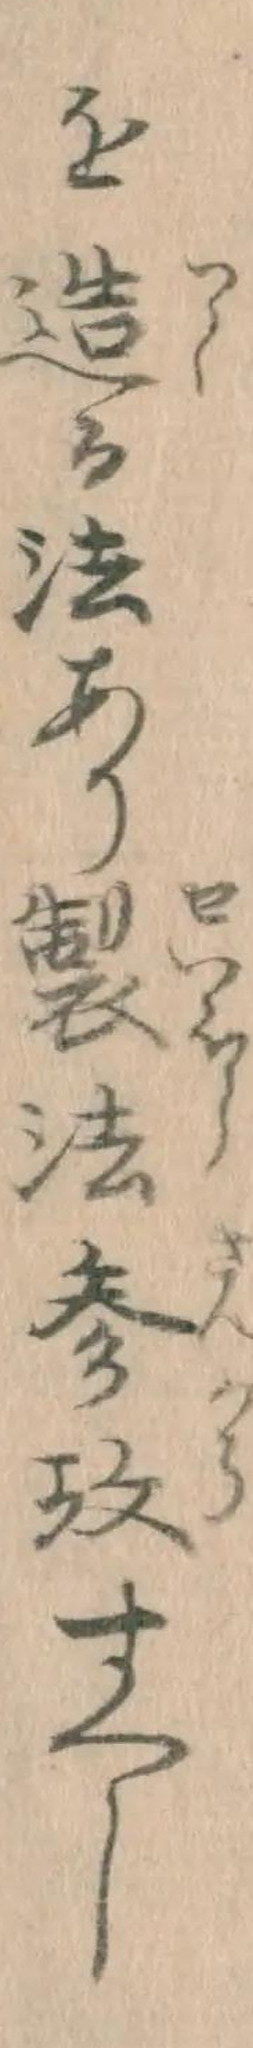を造る法あり製法参攷すへし
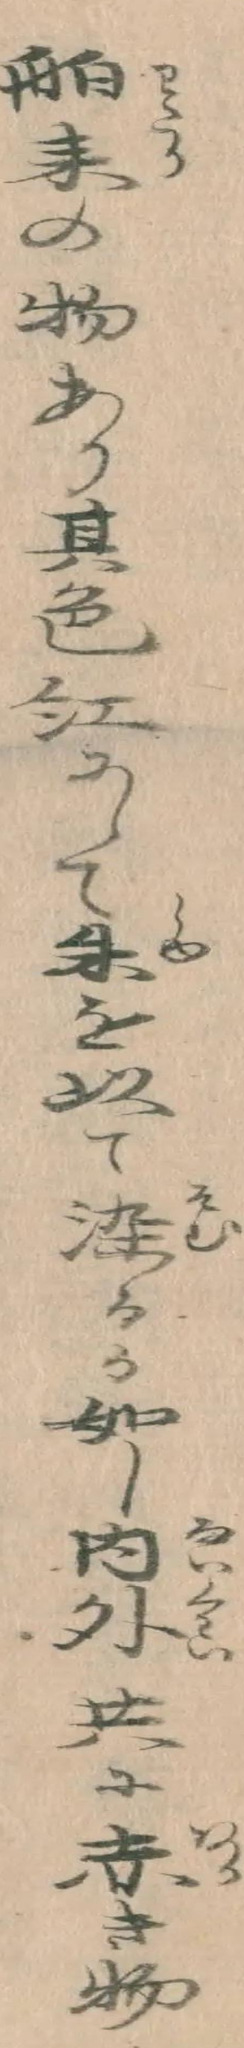舶来の物あり其色紅にして朱を以て染るか如し内外共に赤き物
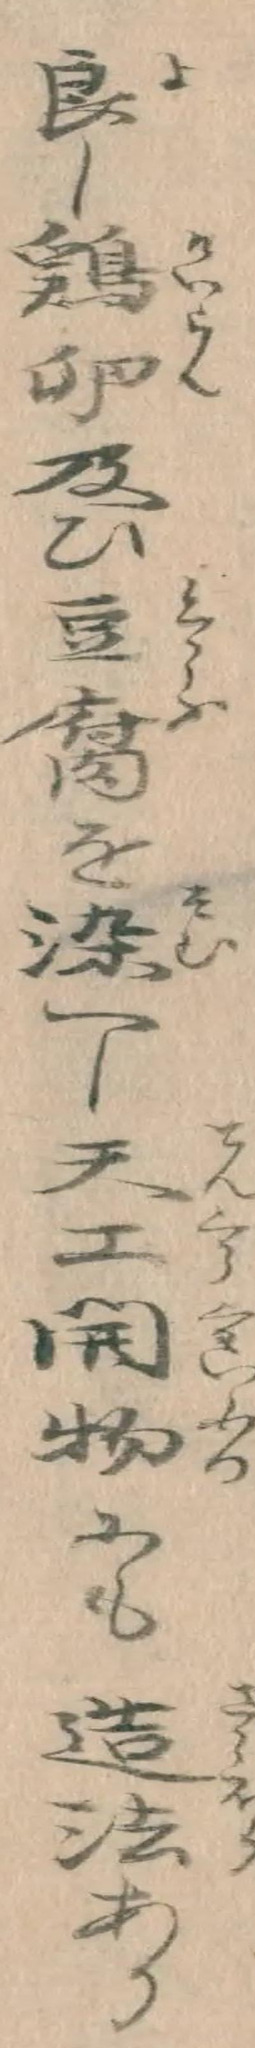良し鶏卵及ひ豆腐を染へし天工開物にも造法あり

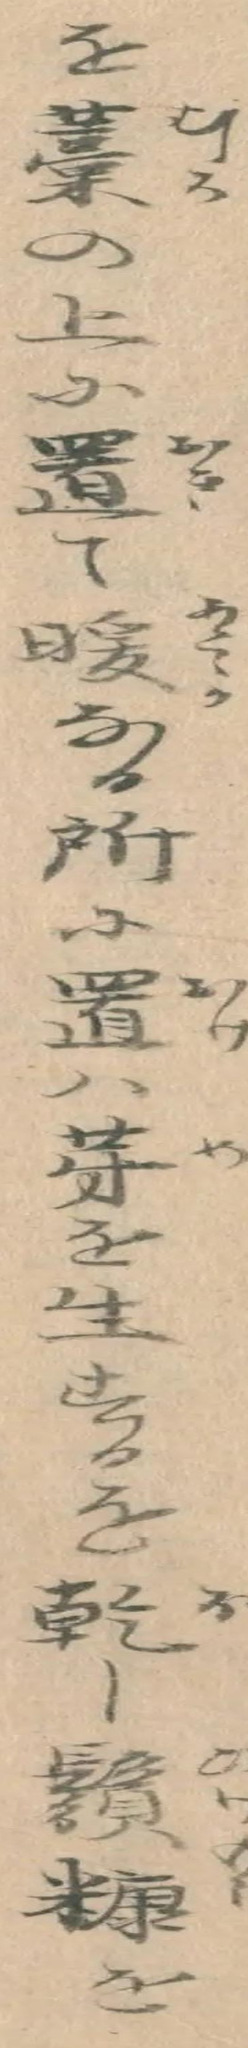を藁の上に置て暖なる所に置は芽を生するを乾し鬚糠を
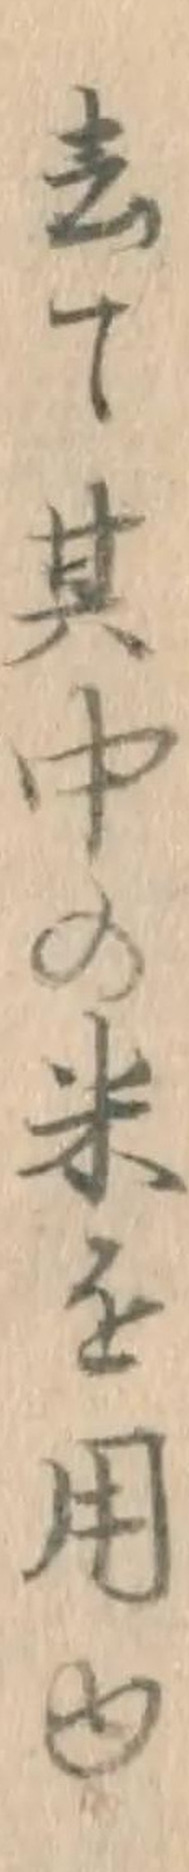去て其中の米を用ゆ
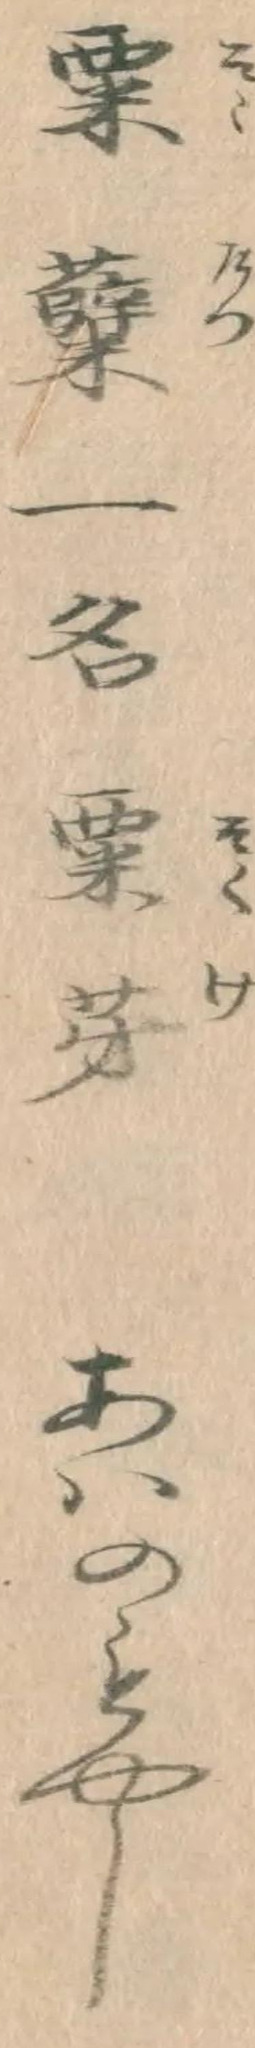粟糵一名粟芽あはのもやし
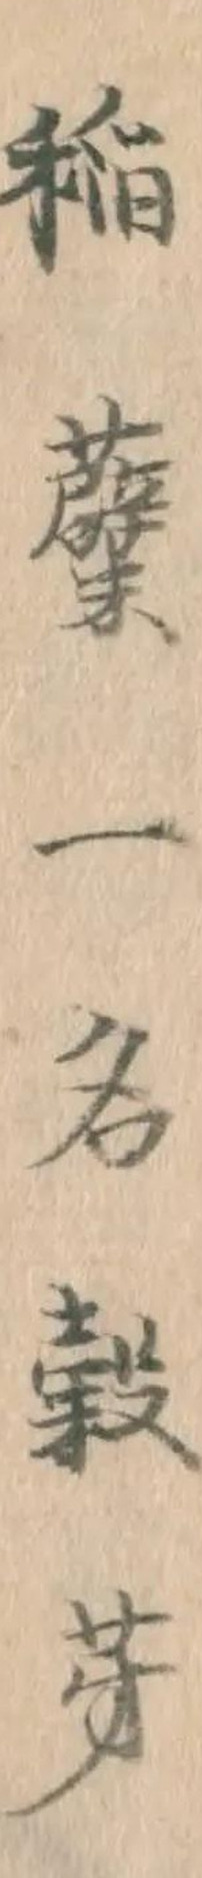稲糵一名穀芽
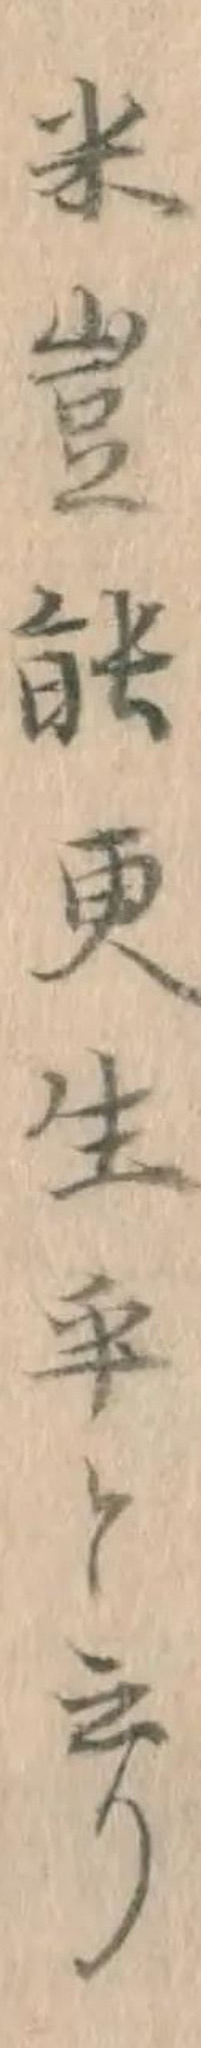米豈能更生乎と云り
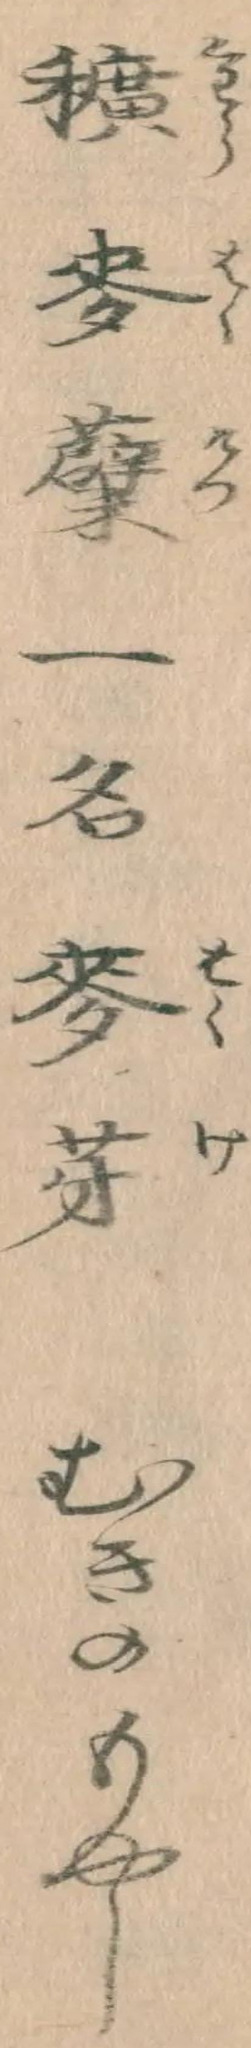穬麦糵一名麦芽むきのもやし
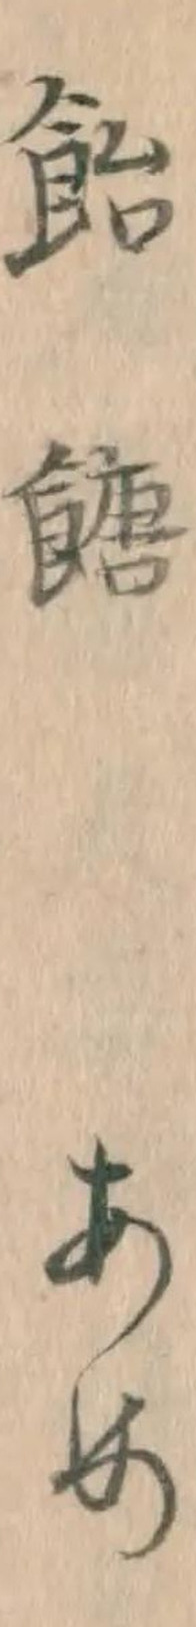飴餹あめ
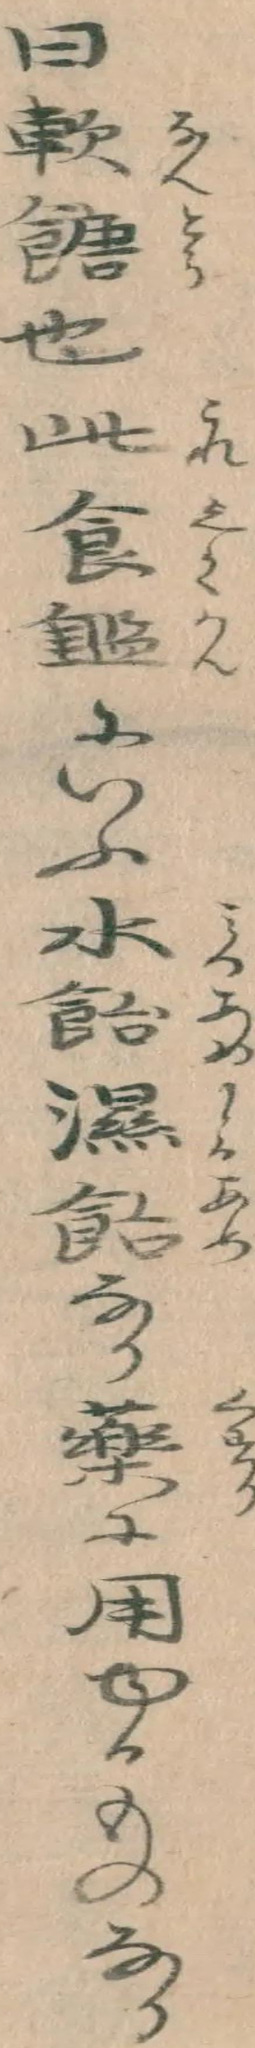曰軟餹也此食鑑にいふ水飴湿飴なり薬に用ゆるものなり
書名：本草図譜. 巻43-45
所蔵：国立国会図書館 National Diet Library, JAPAN
